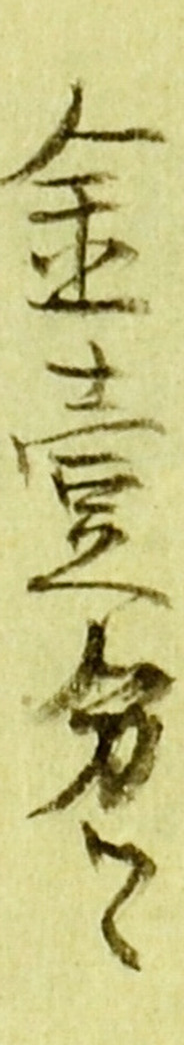金壱分善八
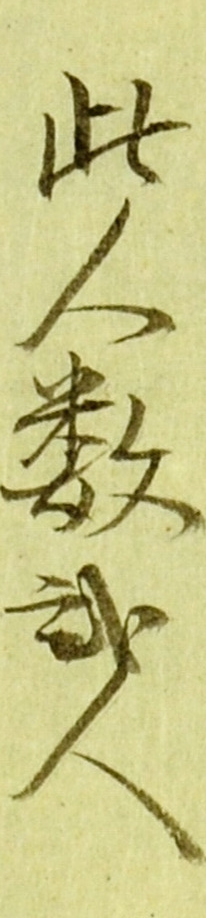此人数弐人
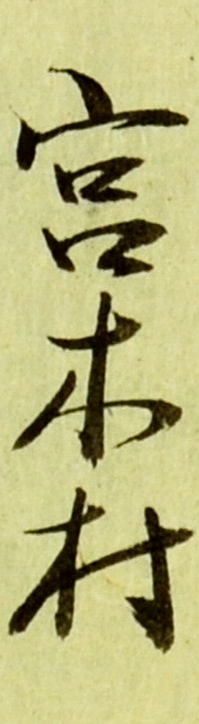宮木村
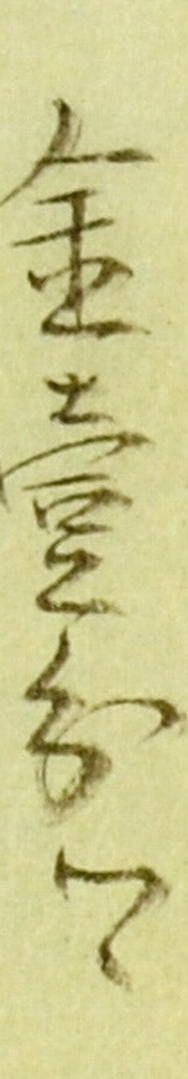金壱分善八
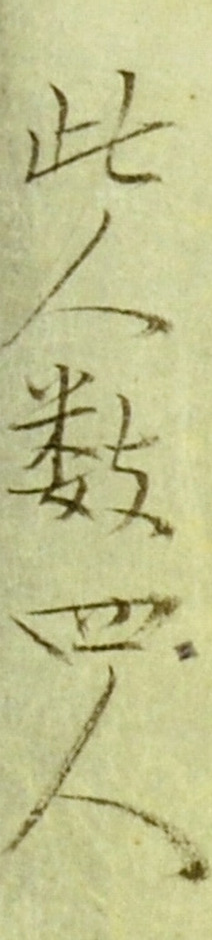此人数四人

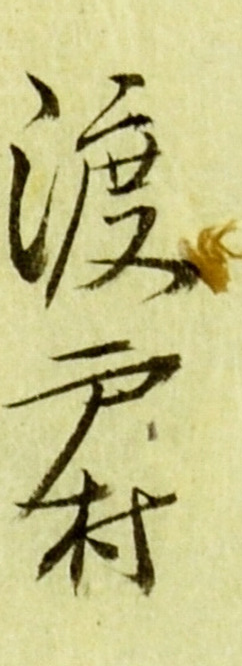渡戸村
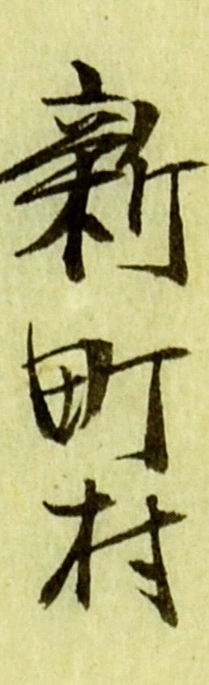新町村
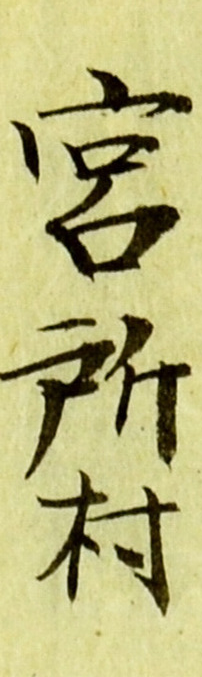宮所村
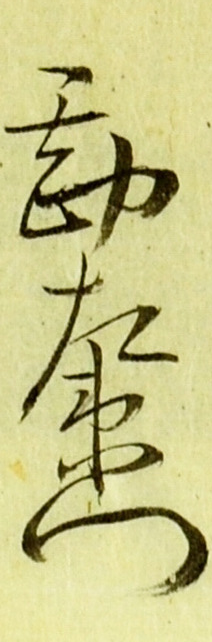伝左衛門
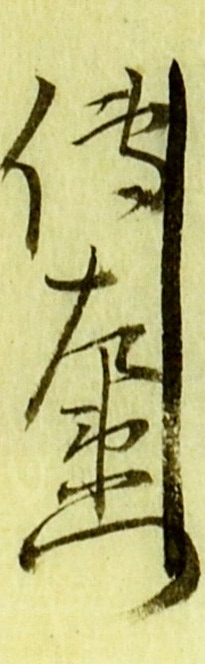伝左衛門
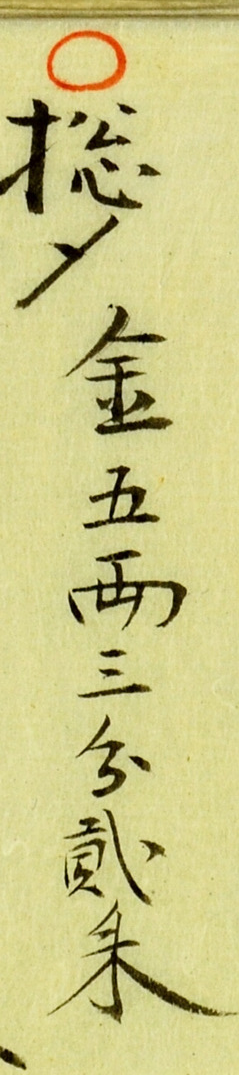〇総〆金五両三分弐朱
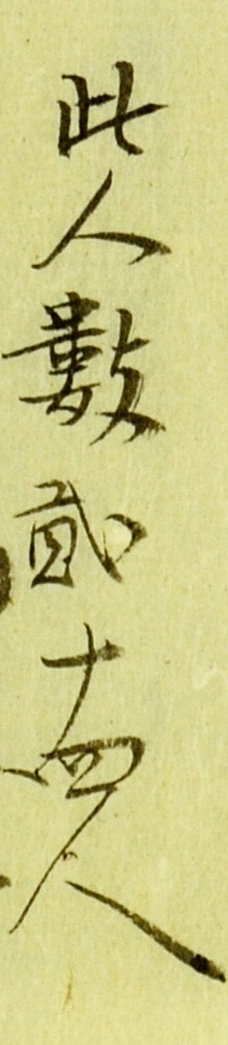此人数弐十四人
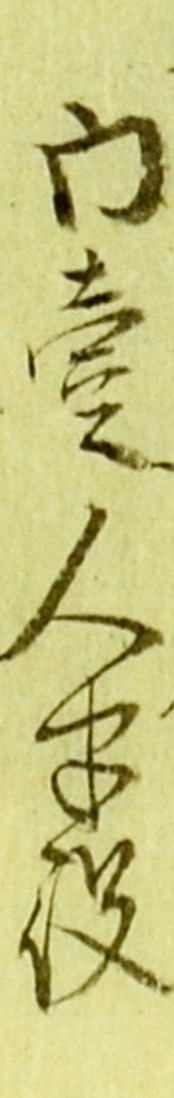内壱人半役
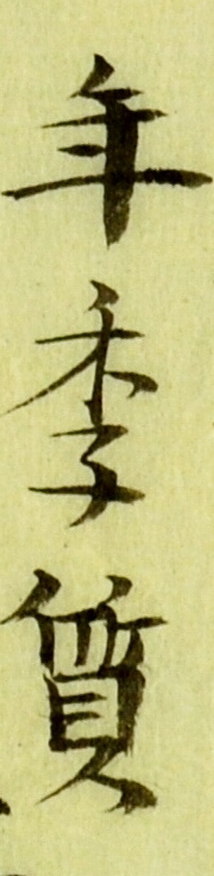年季質
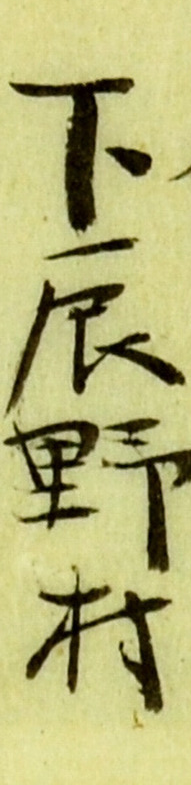下辰野村
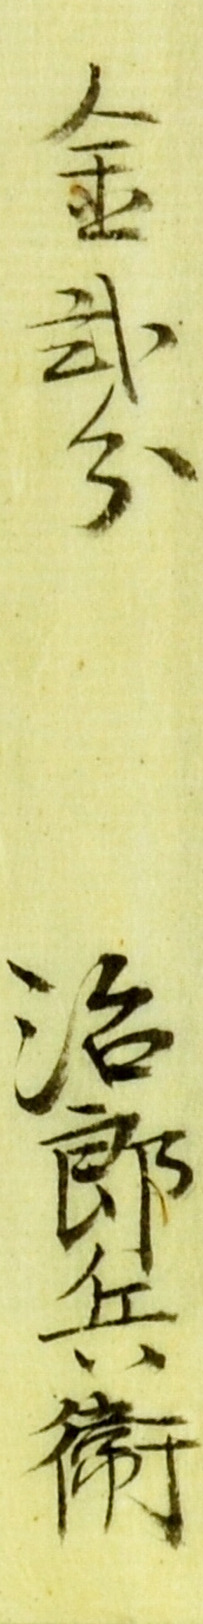金弐分治郎兵衛
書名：上伊那郷諸運上取調帳
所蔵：伊那市立高遠町図書館・合同会社AMANE
